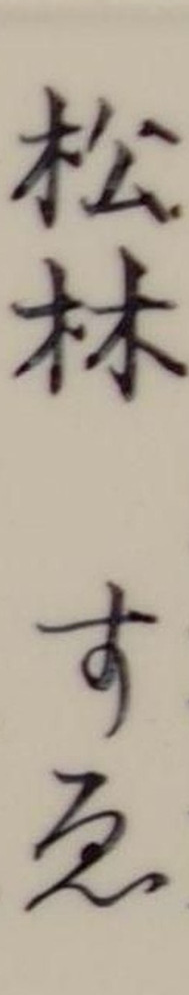松林すえ
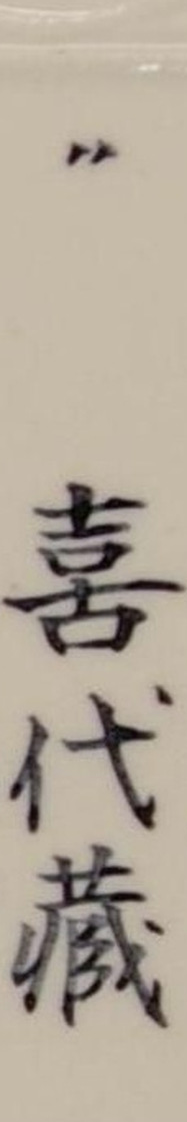喜代蔵
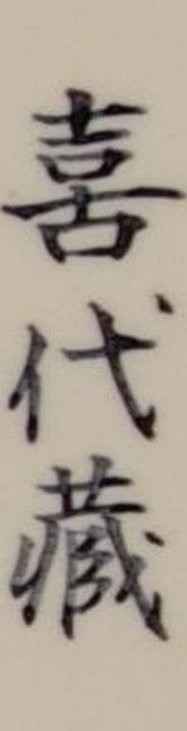喜代蔵
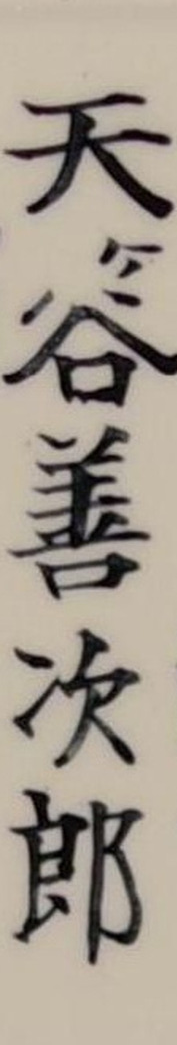天ヶ谷善次郎
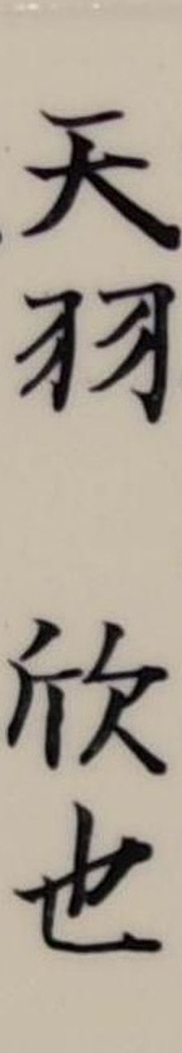天羽欣也
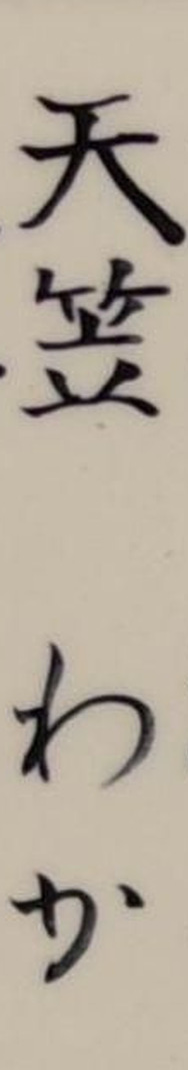天竺わか
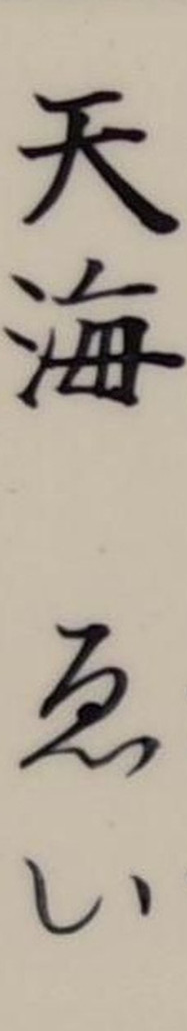天海えい
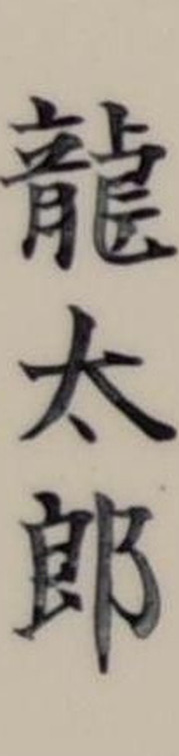龍太郎
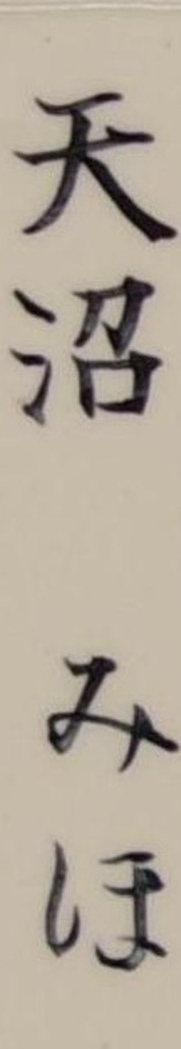天沼みほ

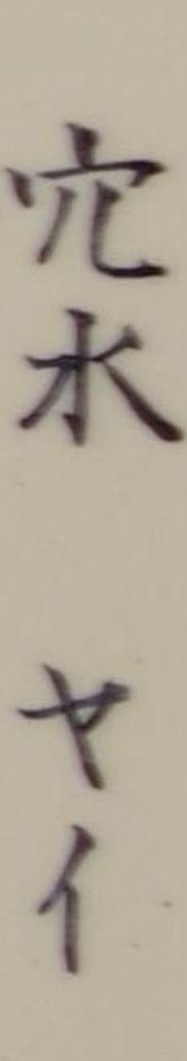穴水ヤイ
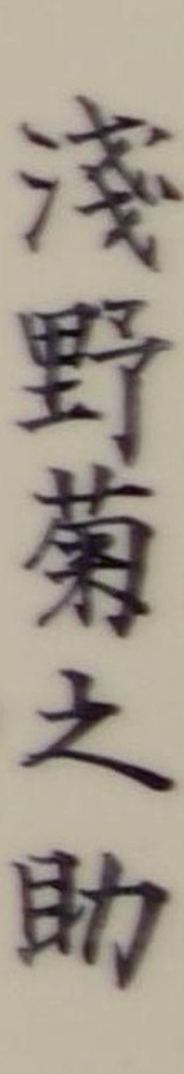浅野菊之助
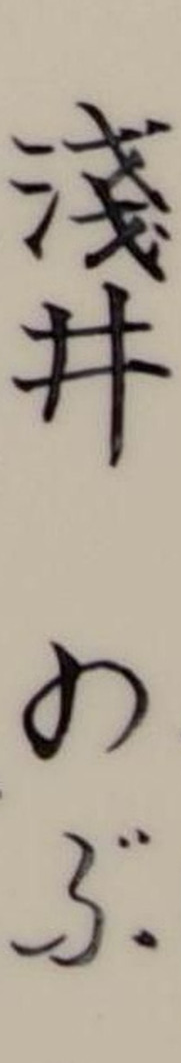浅井のぶ
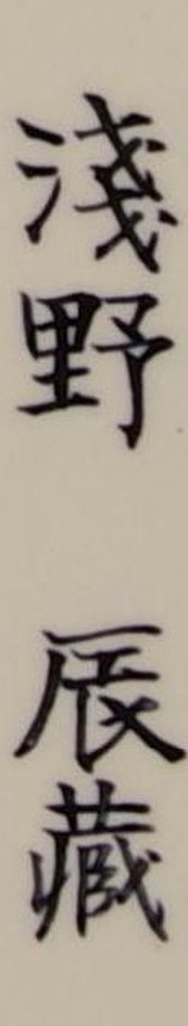浅野辰蔵
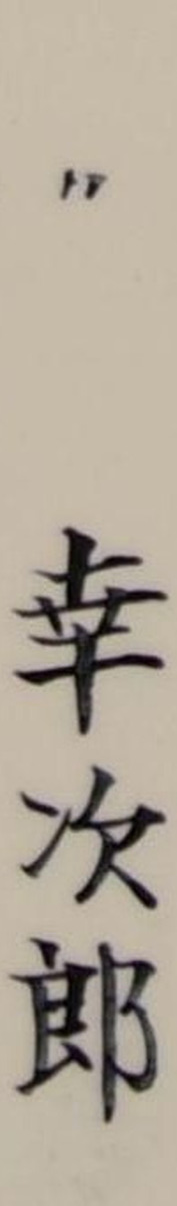幸次郎
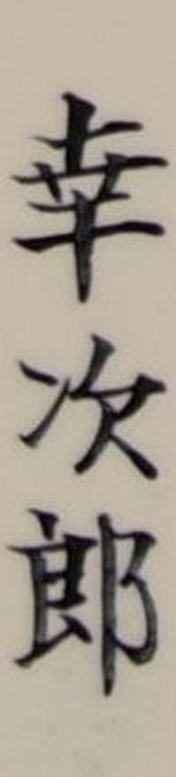幸次郎
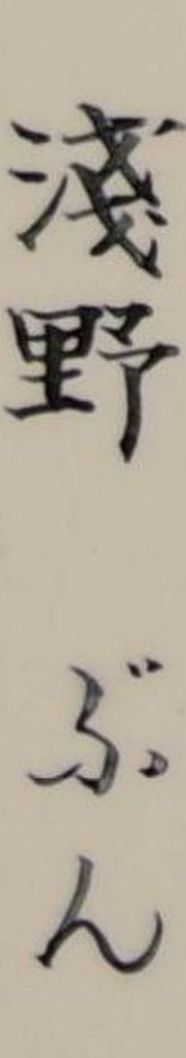浅野ぶん
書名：E~L
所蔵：高野山金剛峯寺
